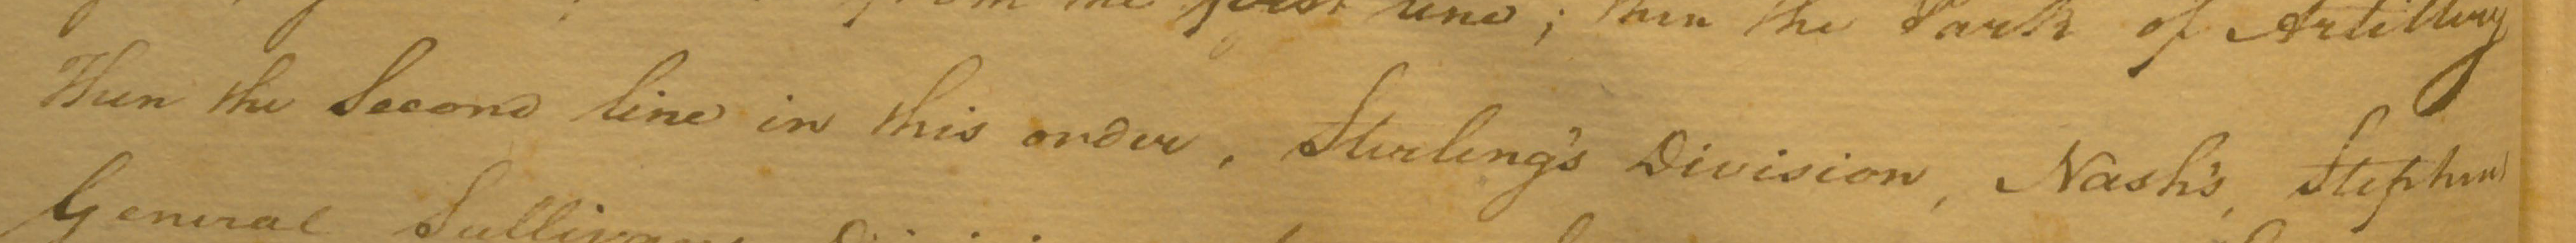Then the Second line in this order, Sterling's Division, Nash's Stephens
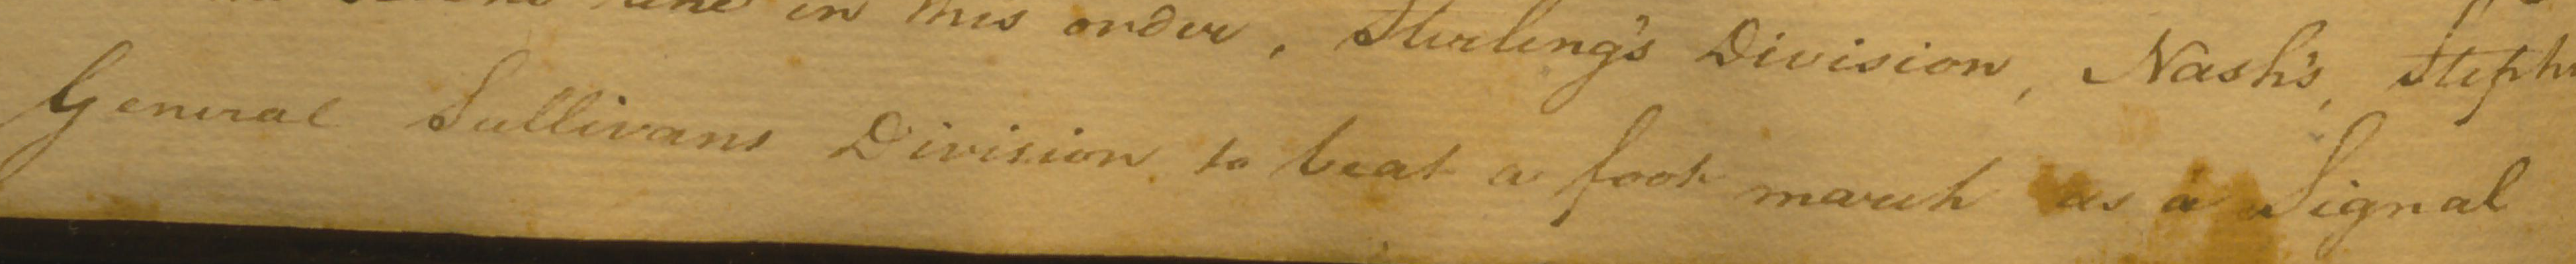General Sullivans Division to beat a foot march as a Signal
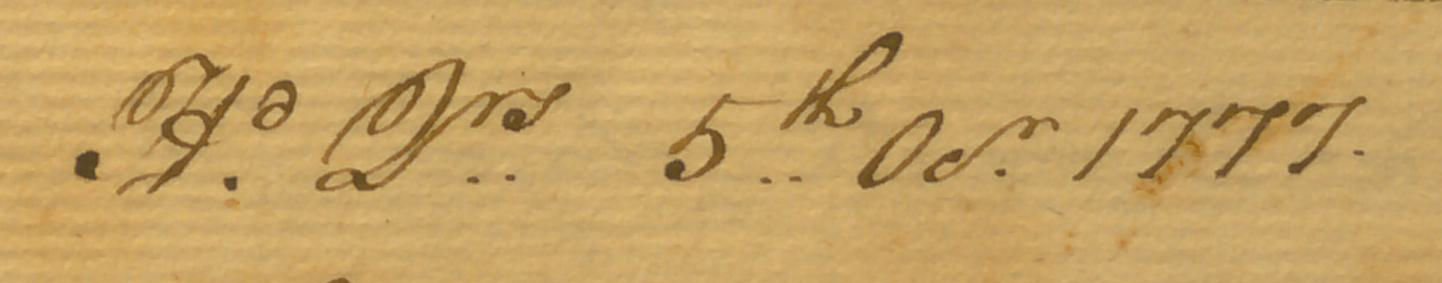H^d. Q^rs. 5^th Oc^r. 1777.
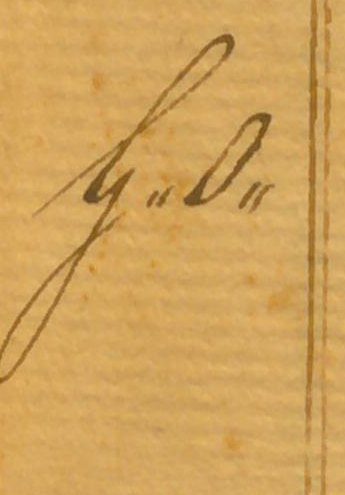G.O.
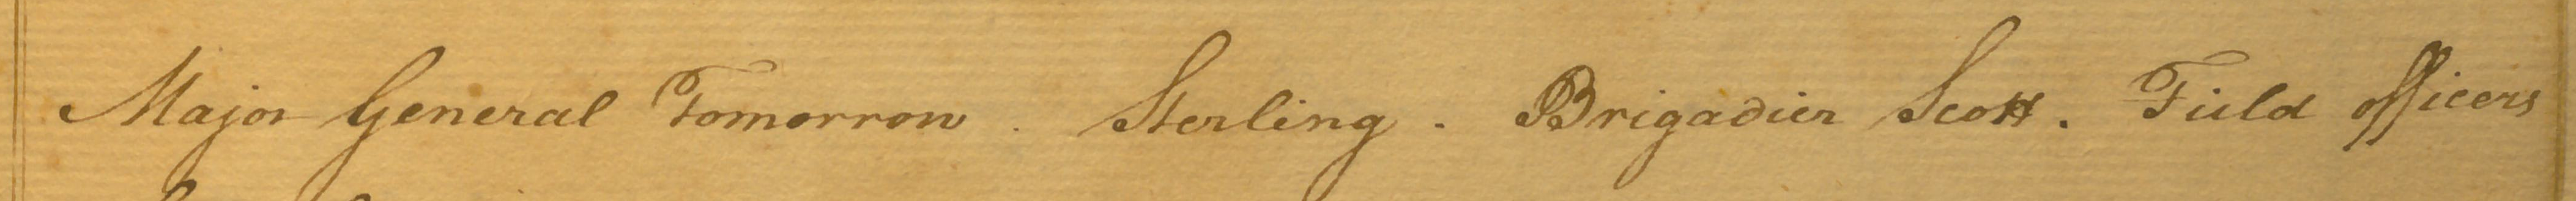Major General Tomorrow. Sterling. Brigadier Scott. Field officers
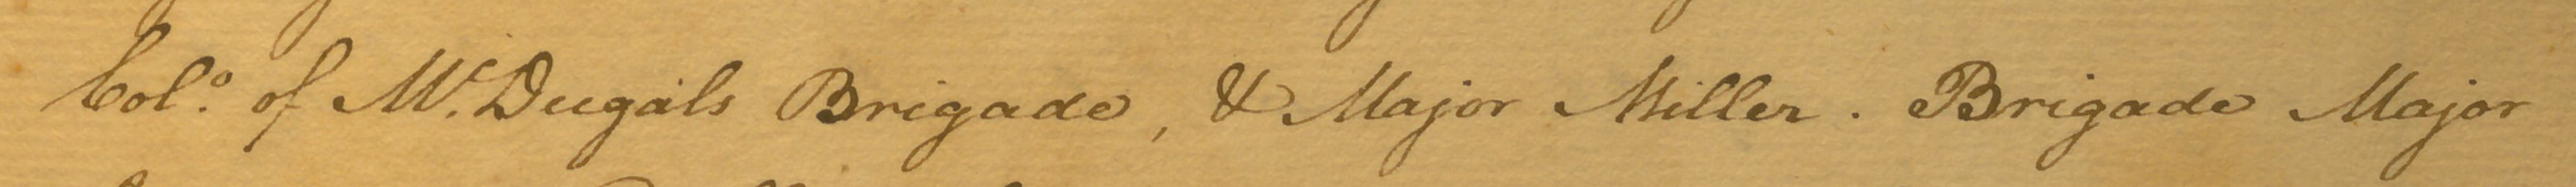Col^o. of M^c. Dugals Brigade, & Major Miller. Brigade Major
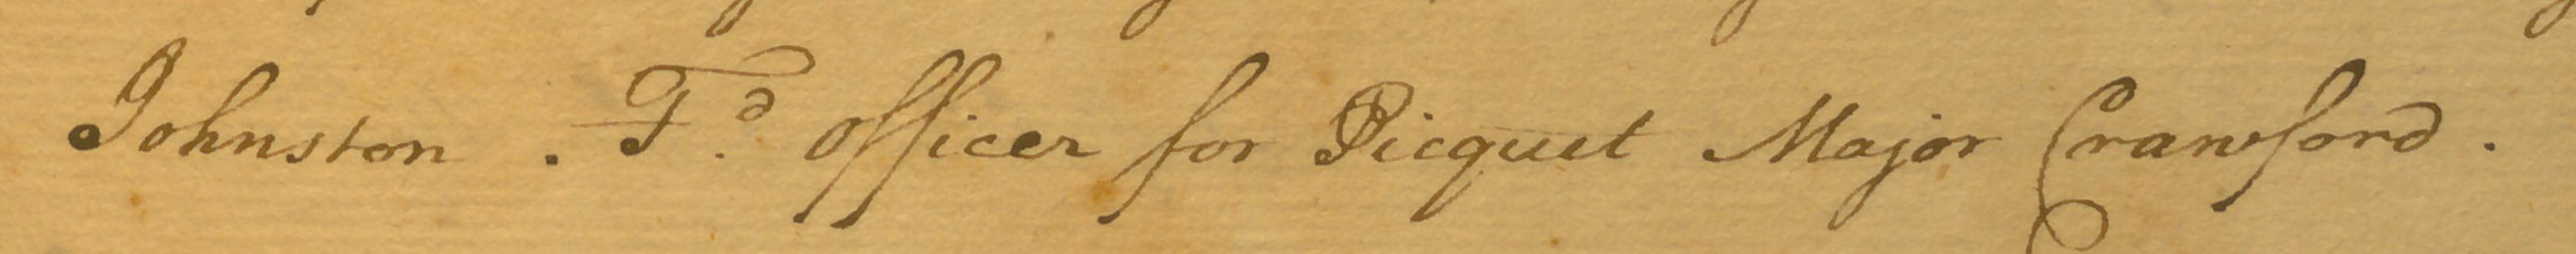Johnston. F^d. officer for Picquet Major Crawford.
